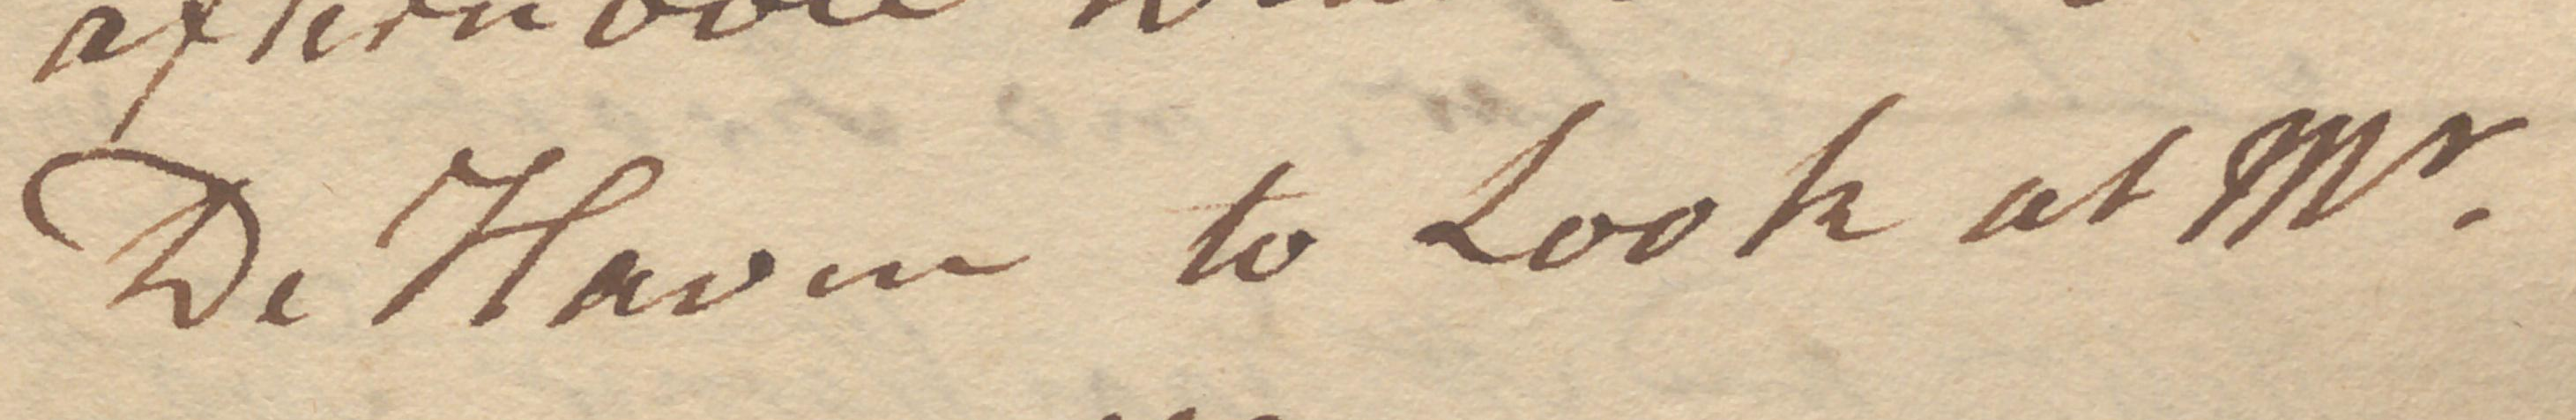DeHaven to Look at M^r.
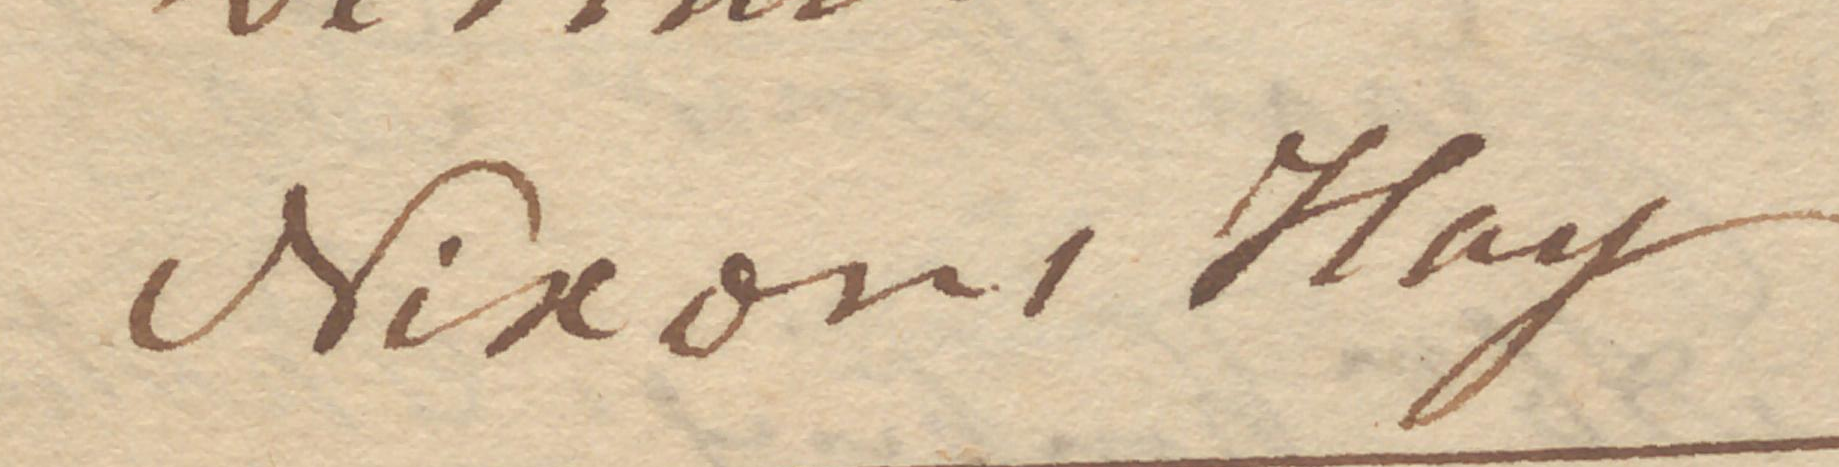Nixons Hay
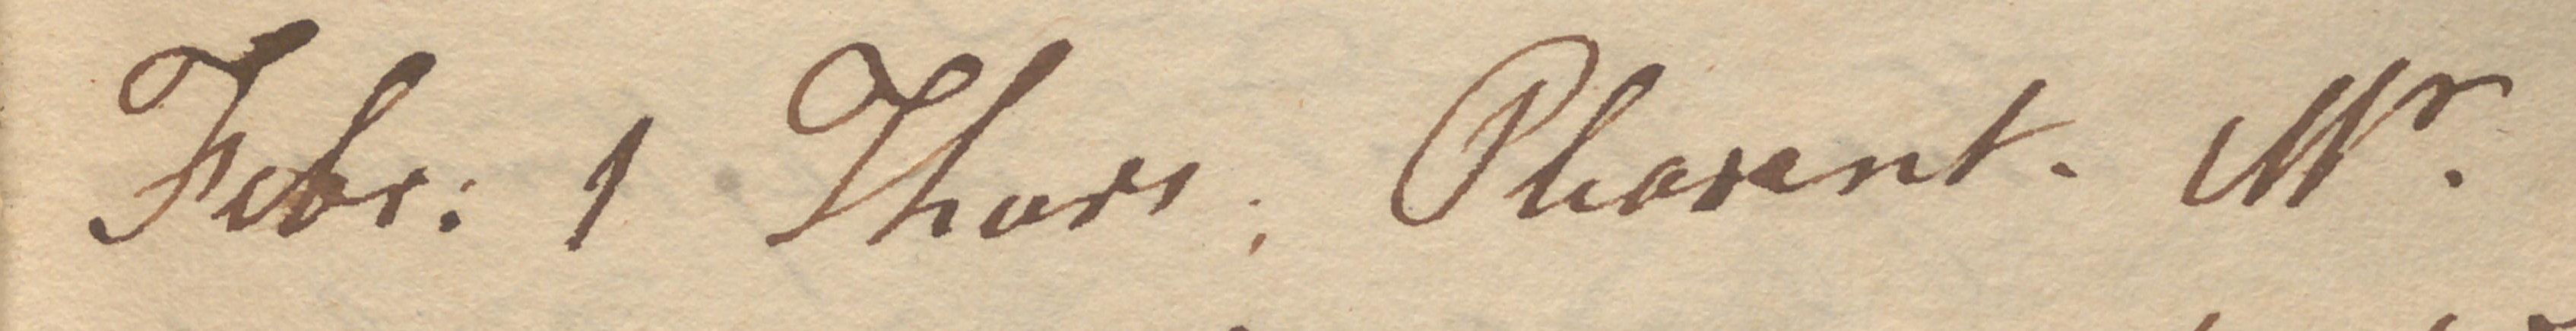Febr: 1 Thurs. Pleasent. M^r.
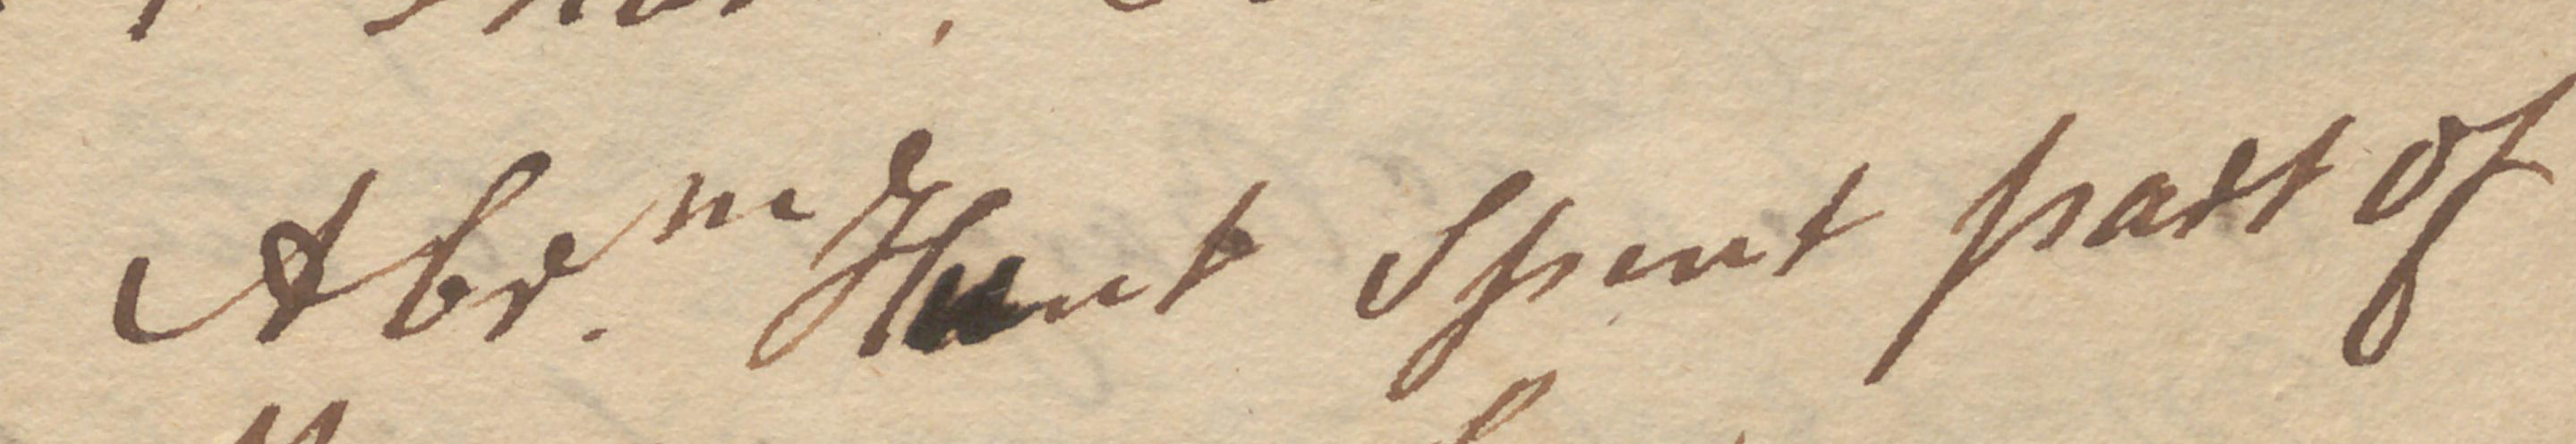Abr^m. Hunt spent part of
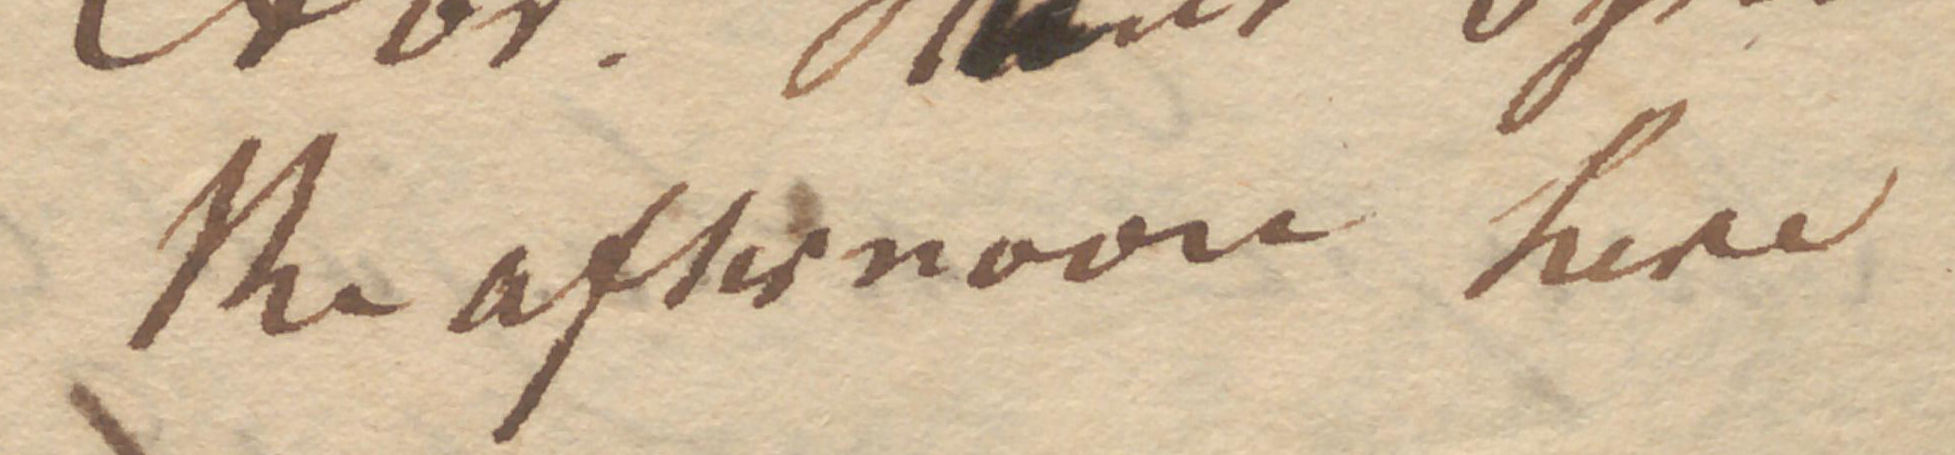the afternoon here
